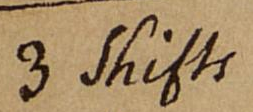3 Shifts
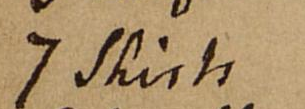7 Shirts
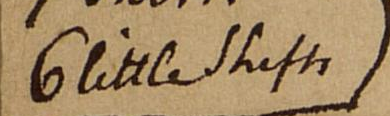6 little Shifts
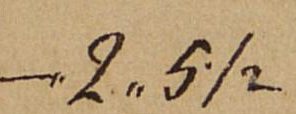- 2 ..5 1/2
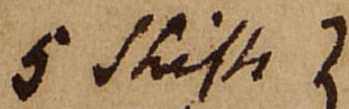5 Shifts
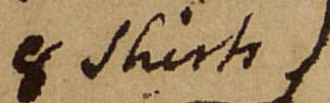8 Shirts
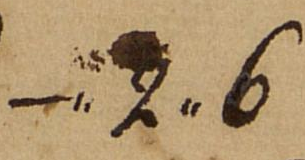- .. 2 .. 6
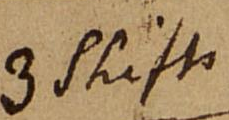3 Shifts
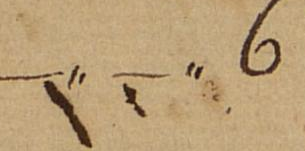- .. - .. 6
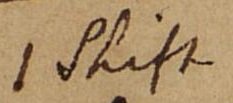1 Shift
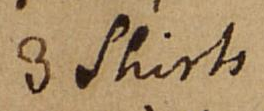3 Shirts
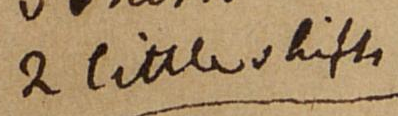2 little shifts
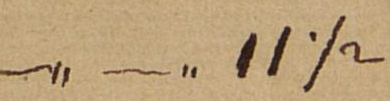- .. - .. 11 1/2
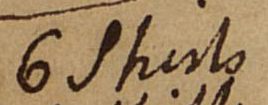6 Shirts
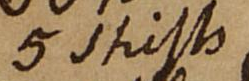5 Shifts
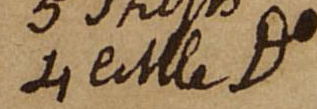4 little D^o
